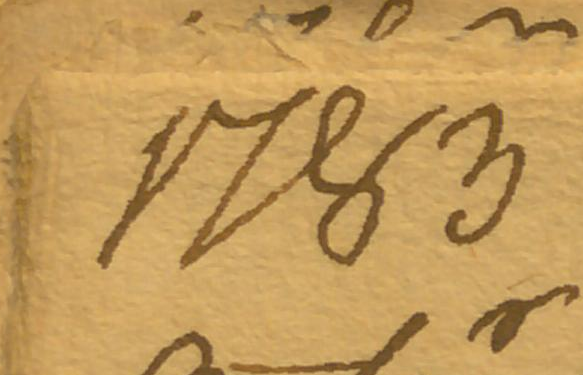1783
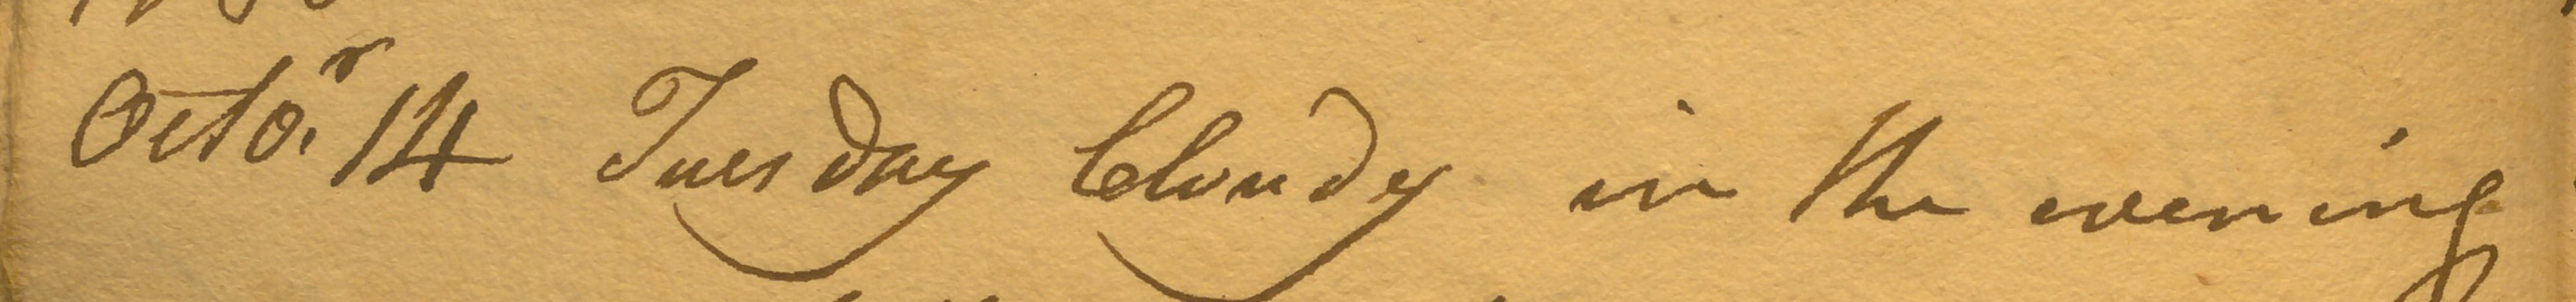Octo^r. 14 Tuesday Cloudy in the evening
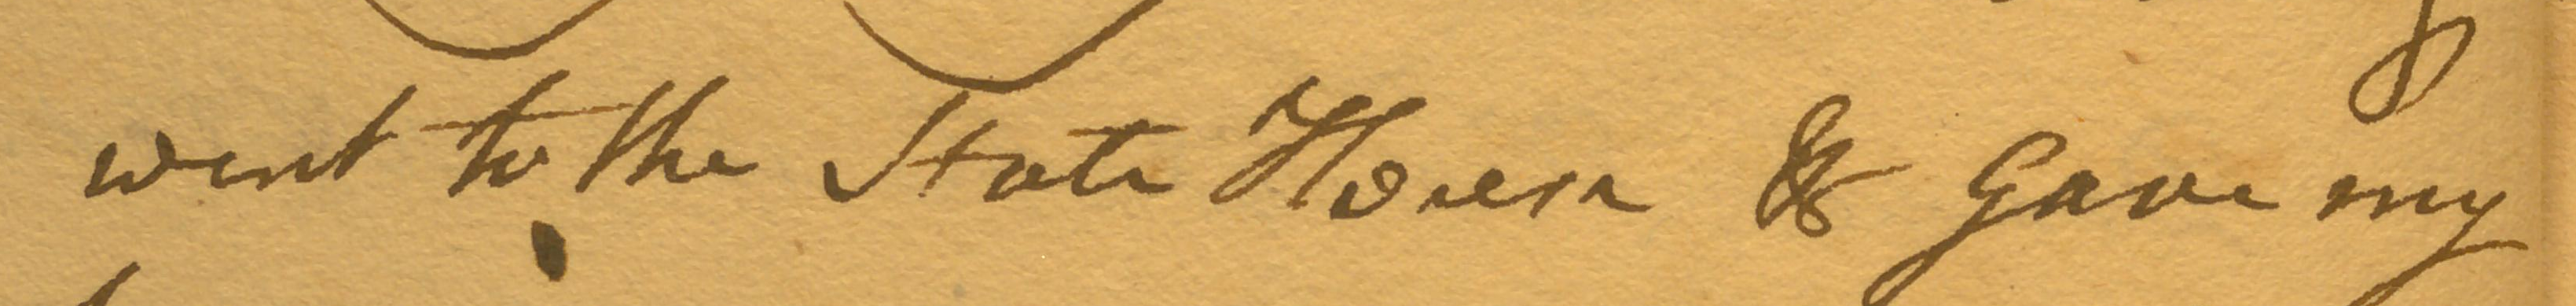went to the State House & Gave my
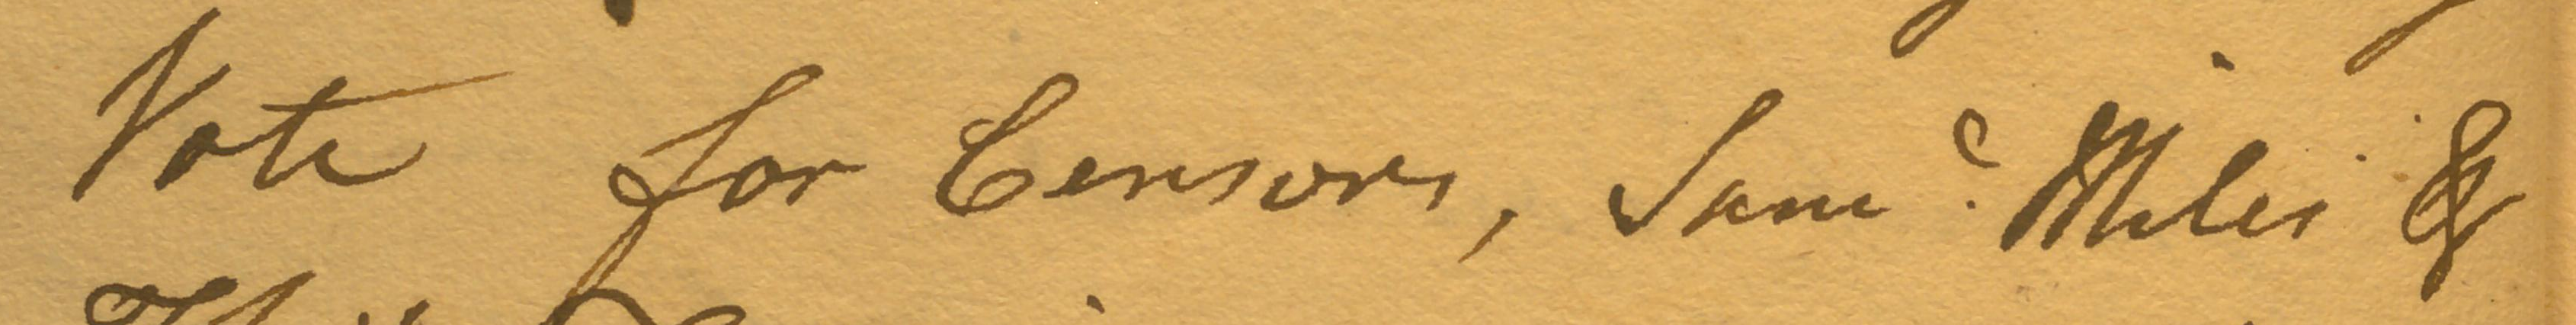Vote for Censors, Sam^l. Miles &
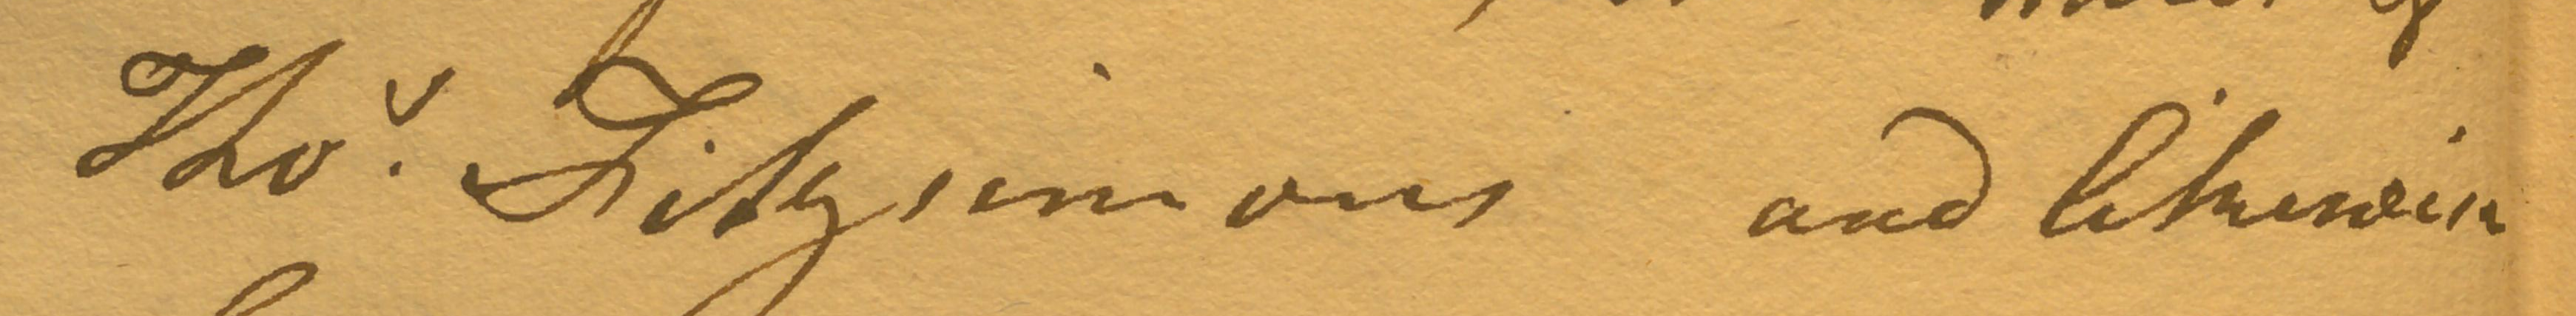Tho^s. Fitzsemons and likewise
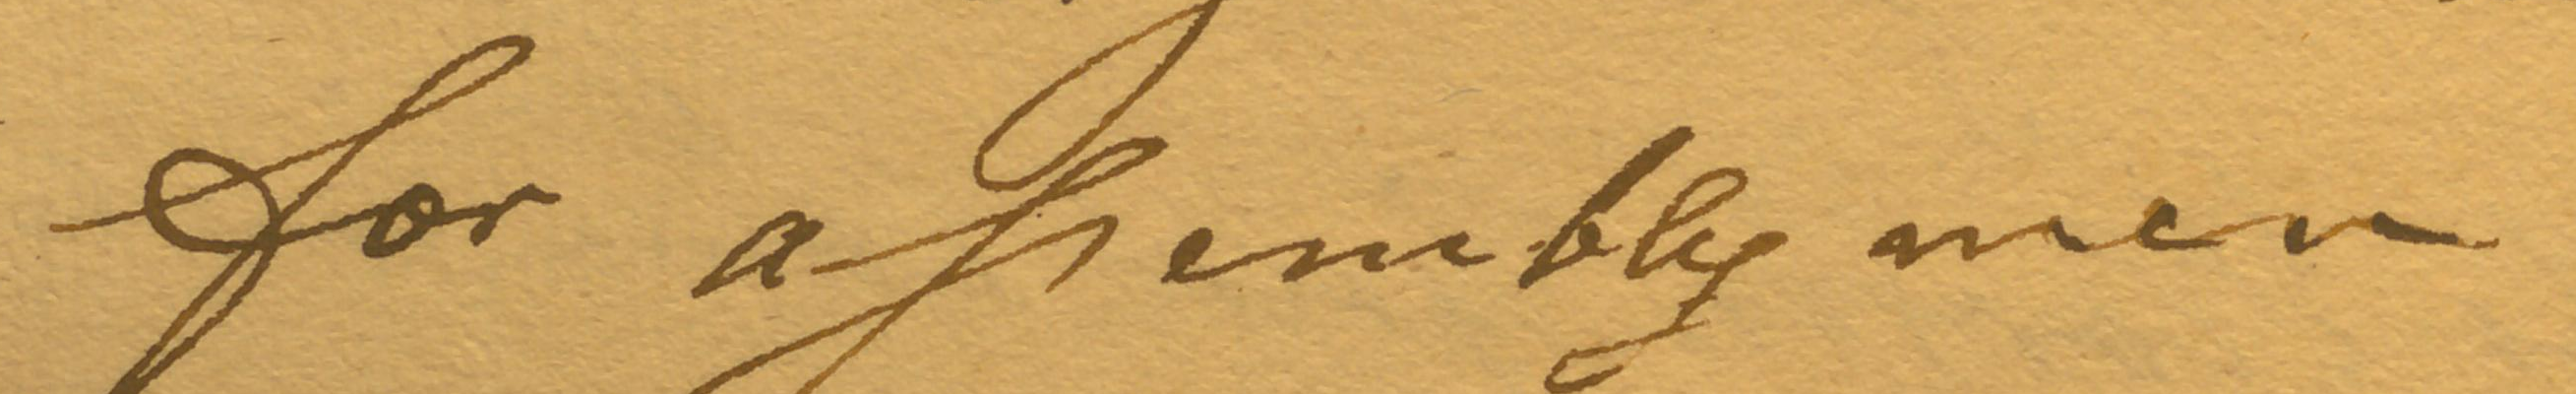for assembly men
